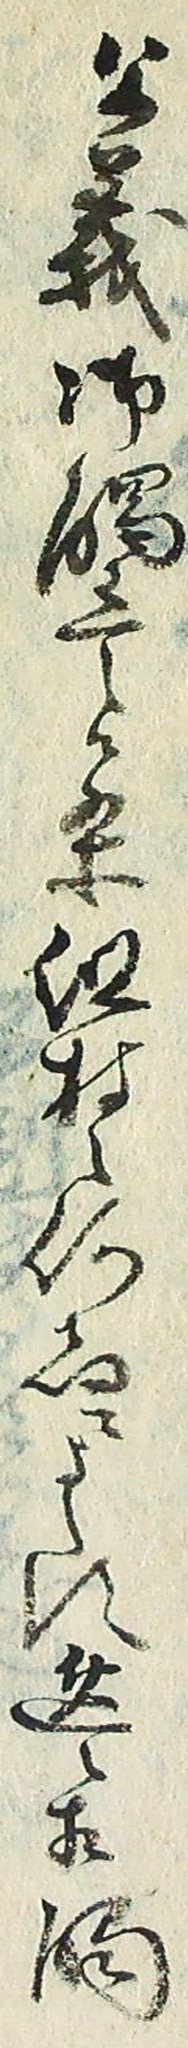公儀御触有之候条組村々何者によらす逸々相触
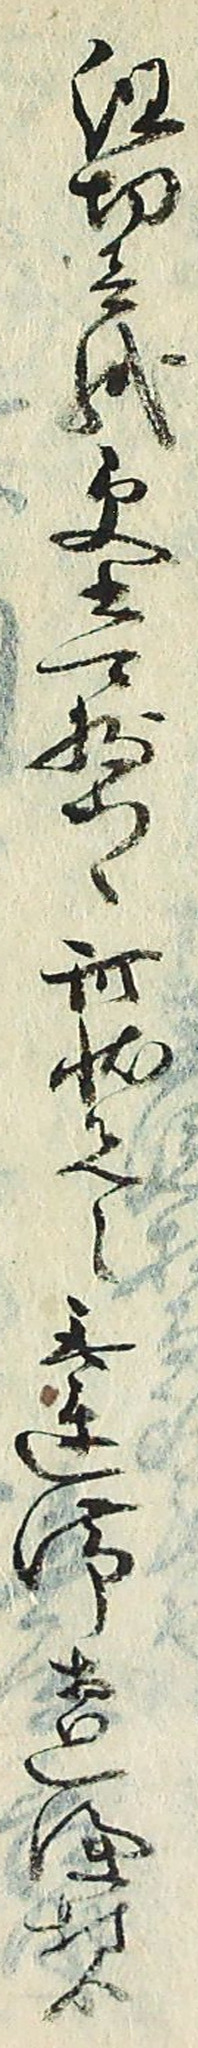組切壱紙受書可指出候此状先々無遅滞相廻留村ゟ
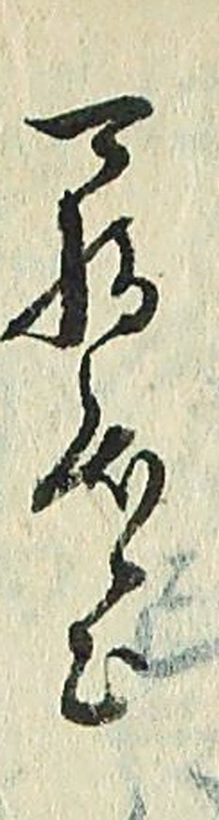可指戻候以上
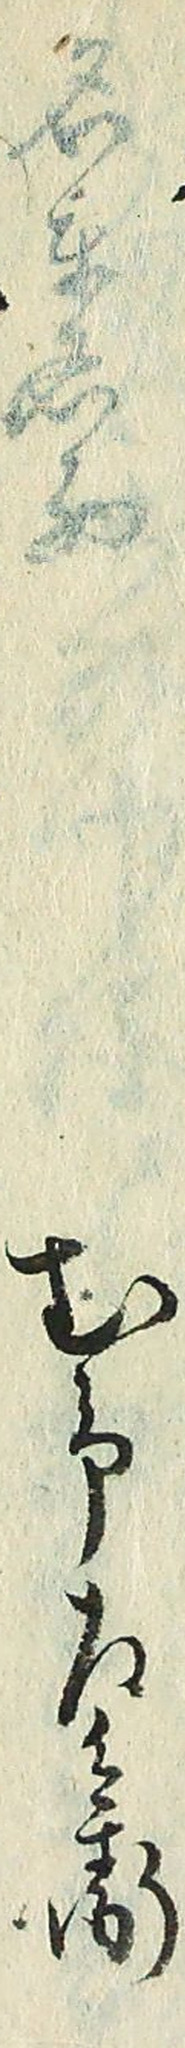武市左兵衛
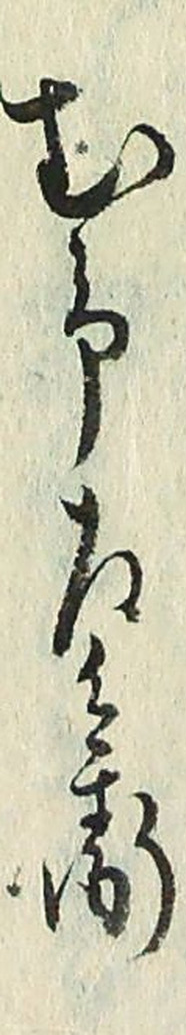武市左兵衛
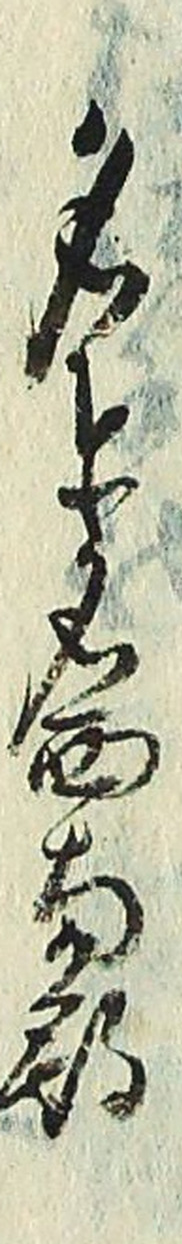名東名西両郡
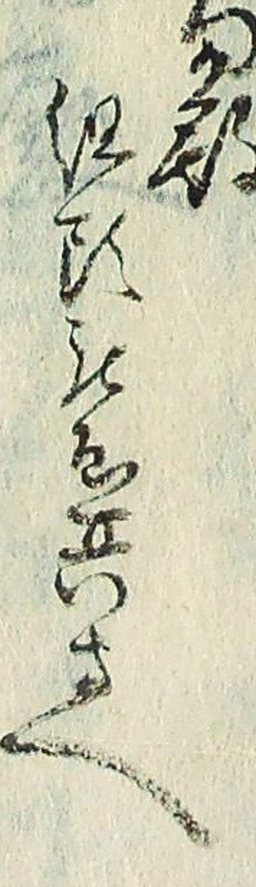組頭庄屋共方へ
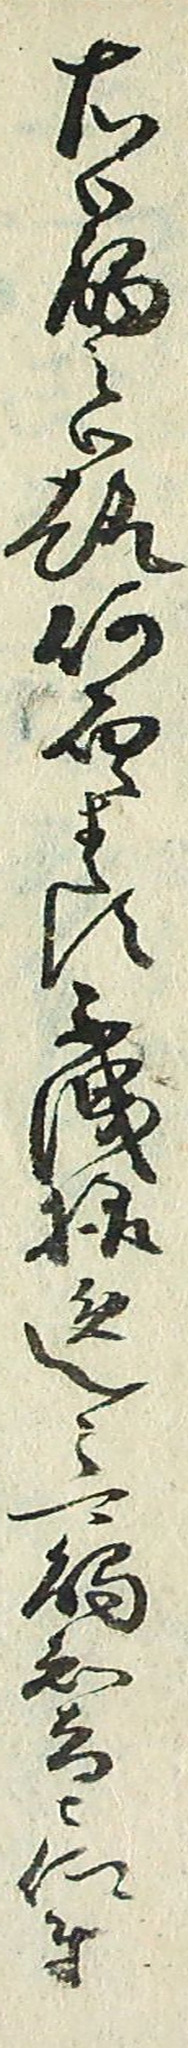右御触之御趣何者によらす不洩様逸々可触旨被仰付
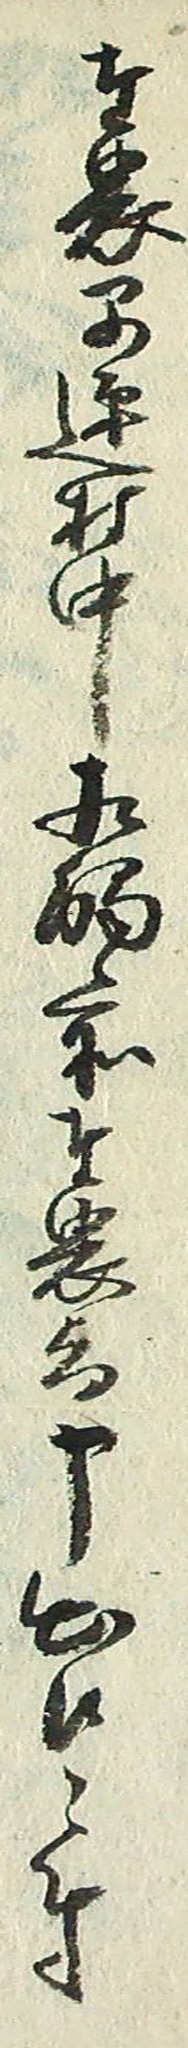奉畏早速村中相触候所奉畏旨申出候に付
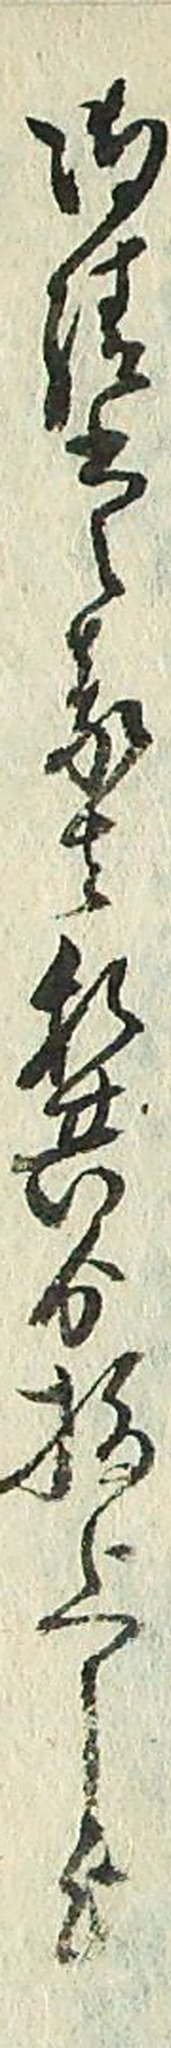御請書之義は私共ゟ指上候以上
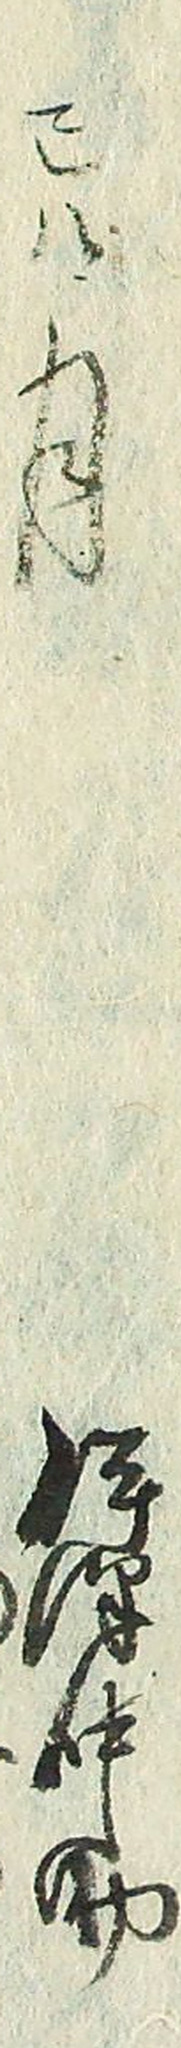巳八月井沢仲助
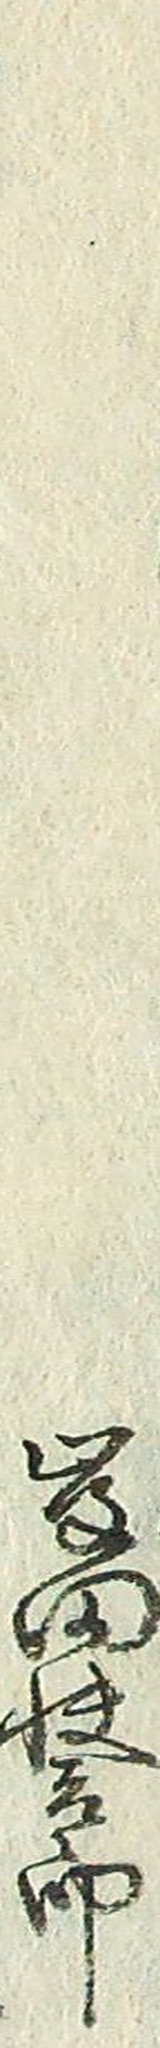岸田快吉郎
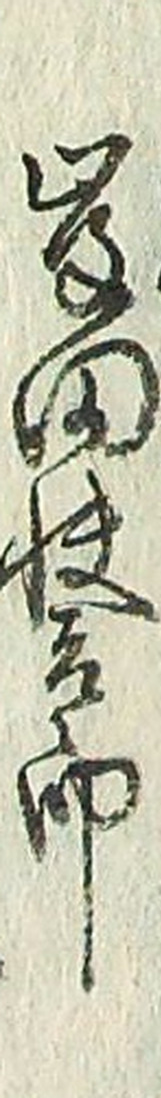岸田快吉郎
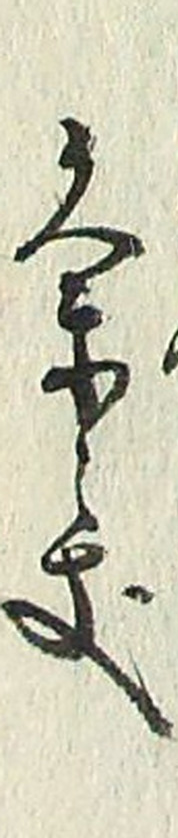久米之丈
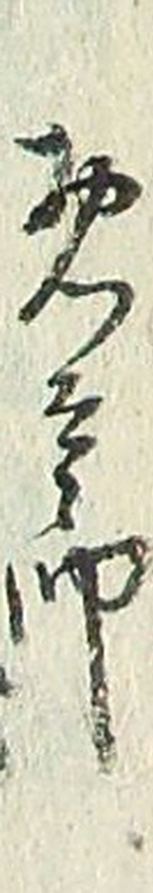惣太郎
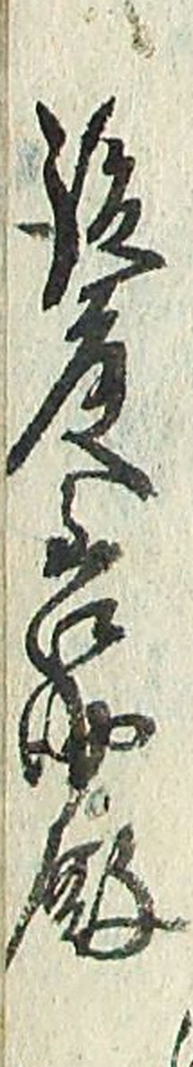後藤善助殿
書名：諸御用御□受書控
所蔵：鳴門教育大学 Naruto University of Education
